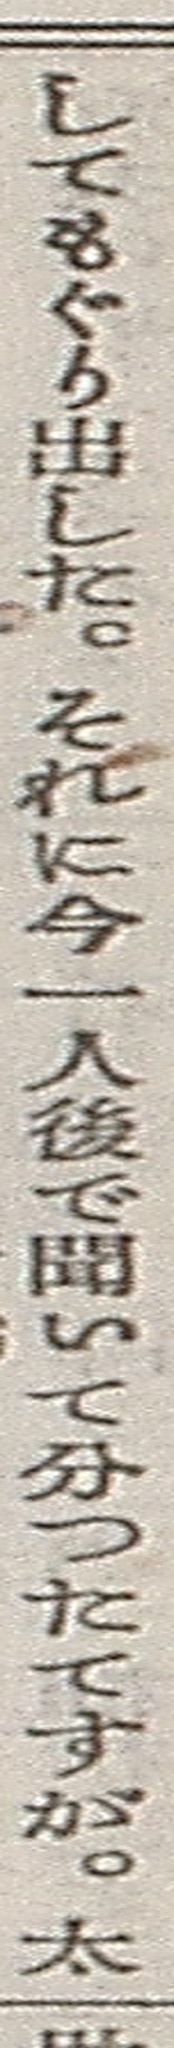してもぐり出した。それに今一人後で聞いて分つたてすが。太
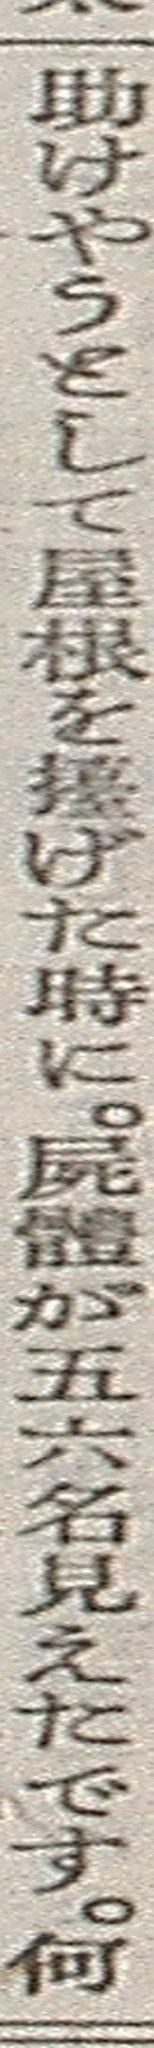助けやうとして屋根を擡げた時に。屍體が五六名見えたです。何
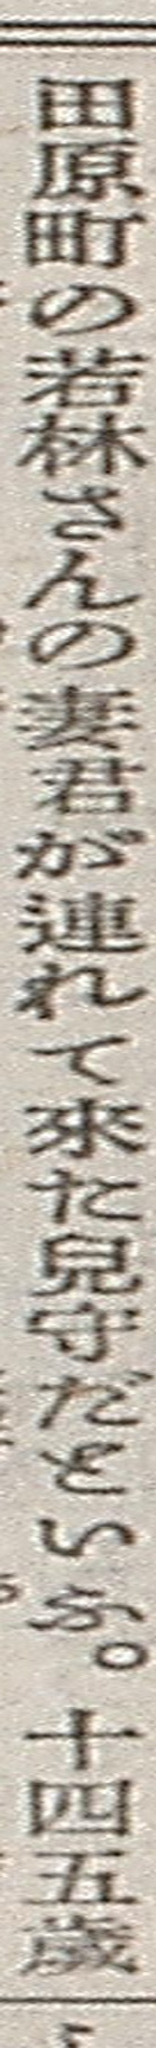田原町の若林さんの妻君が連れてきた児守だといふ。十四五歳
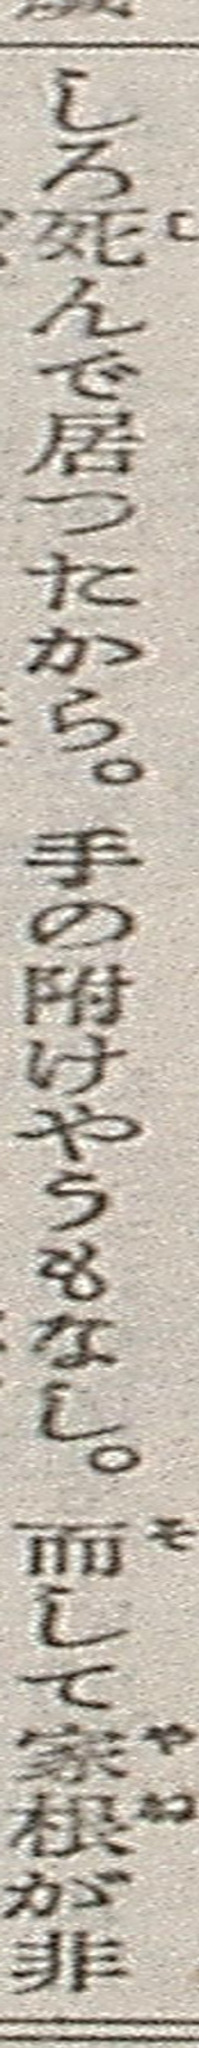しろ死んで居つたから。手の附けやうもなし。而して家根が非
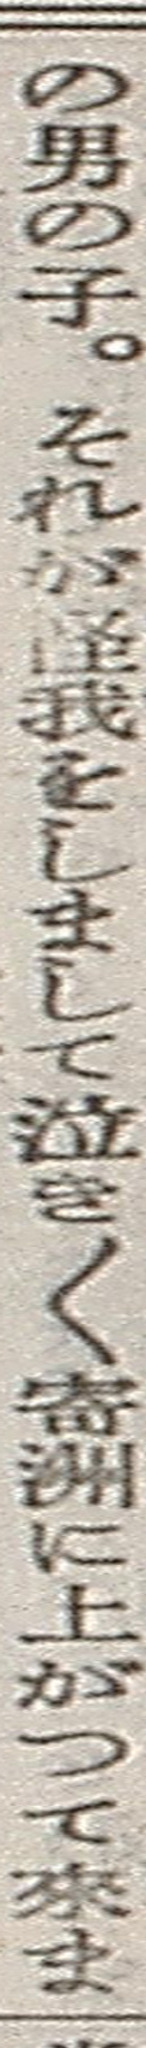の男の子。それが怪我をしまして泣き〳〵寄洲に上がつて来ま
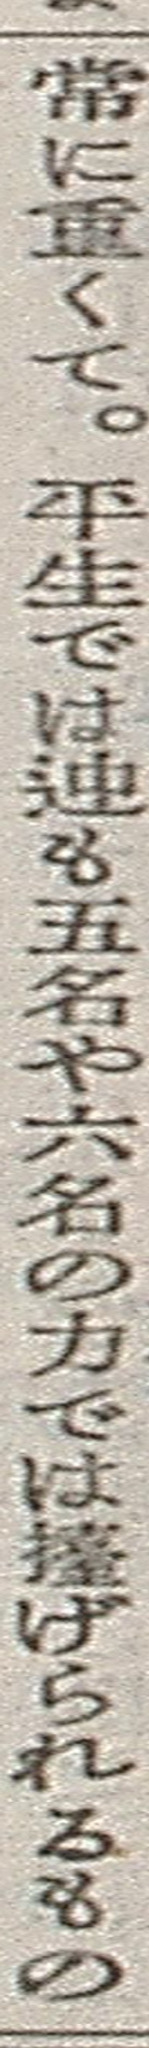常に重くて。平生では迚も五名や六名の力では擡げられるもの
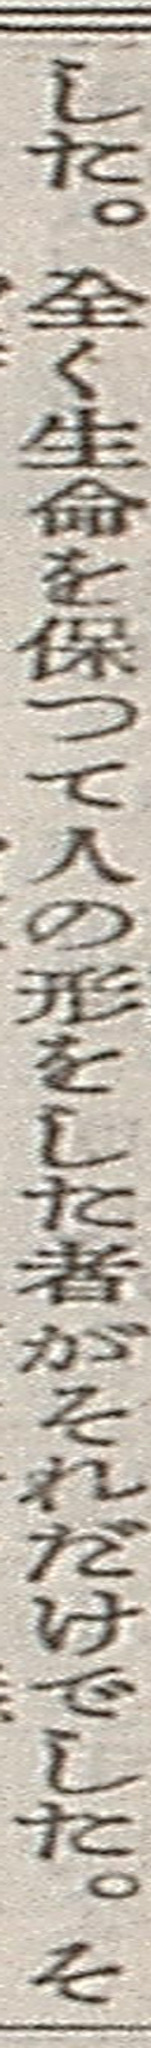した。全く生命を保つて人の形をした者がそれだけでした。そ
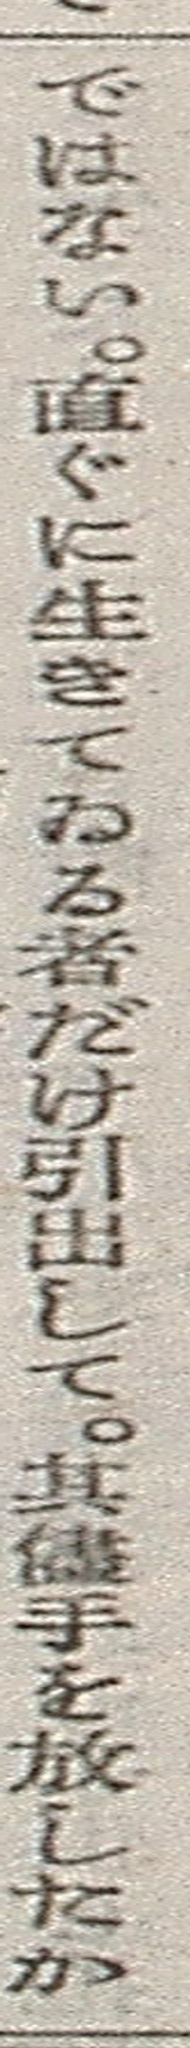ではない。直ぐに生きてゐる者だけ引出して。其侭手を放したか
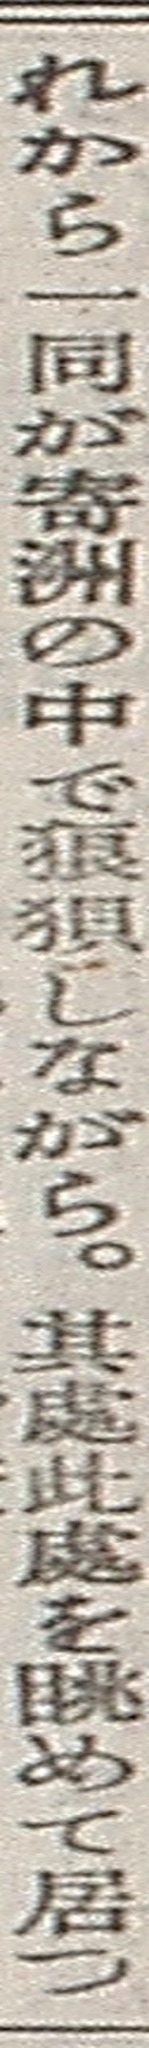れから一同が寄洲の中で狼狽しながら。其処此処を眺めて居つ
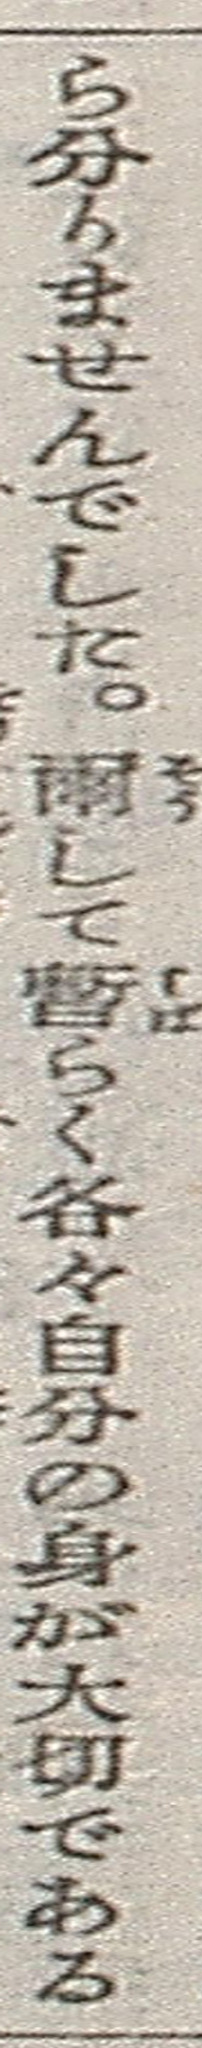ら分りませんでした。爾して暫らく各々自分の身が大切である
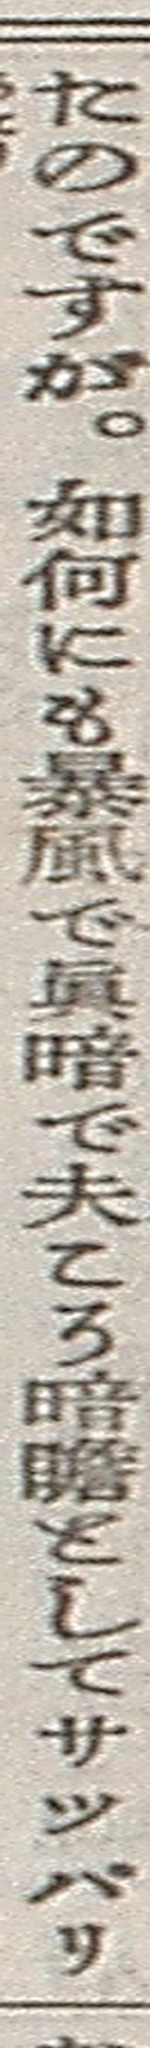たのですが。如何にも暴風で真暗で夫こそ暗澹としてサツパリ
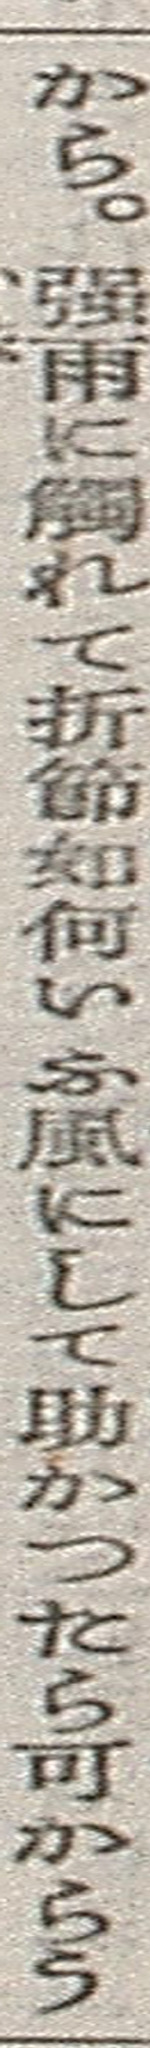から。強雨に触れて折節如何いふ風にして助かつたら可からう
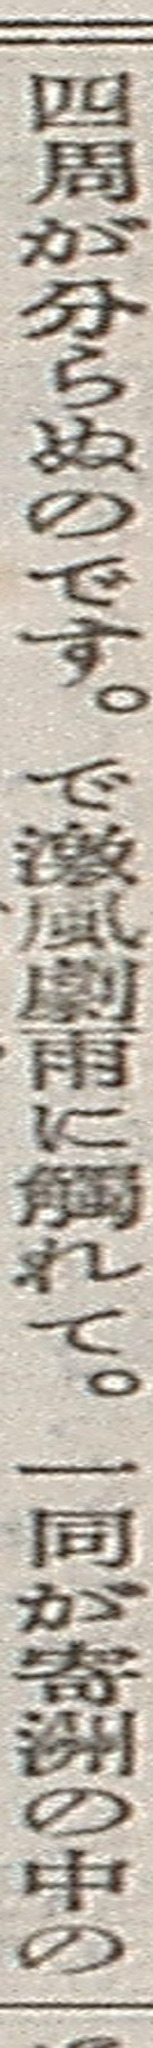四周が分らぬのです。で激風劇雨に触れて。一同が寄洲の中の
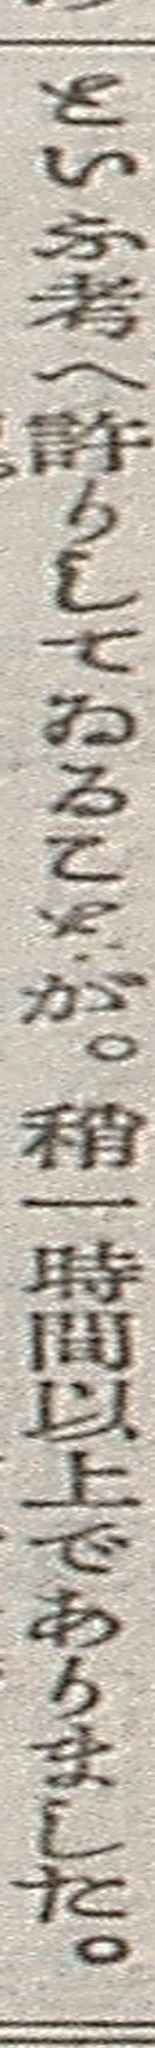といふ考へ許りしてゐることが。稍一時間以上でありました。
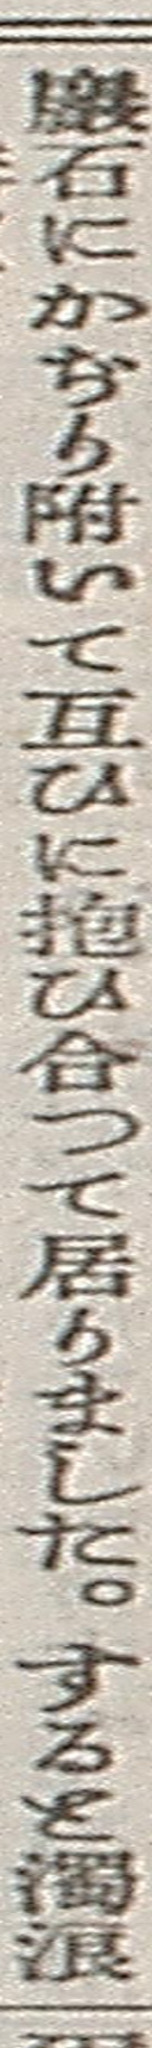巌石にかぢり附いて互ひに抱ひ合つて居りました。すると濁浪
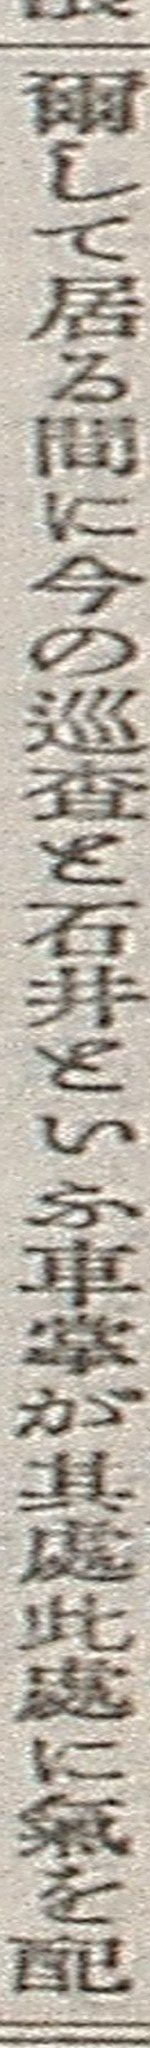爾して居る間に今の巡査と石井といふ車掌が其処此処に気を配
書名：風俗畫報臨時増刊第百九十九號　明治三十二年十月各地災害圖會（前編之續）
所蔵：東京大学地震研究所図書室 Earthquake Research Institute Library, The University of Tokyo, JAPAN
